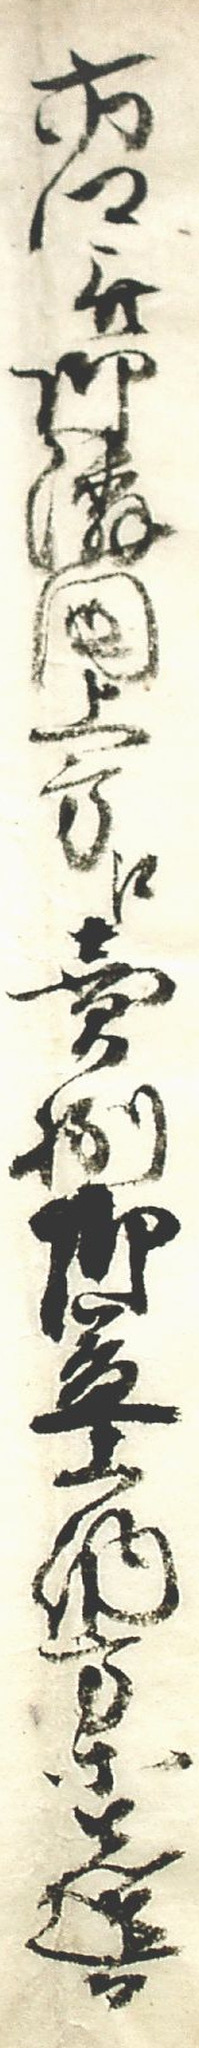市郷幷御漆問上方え売捌御益上納方等先達而
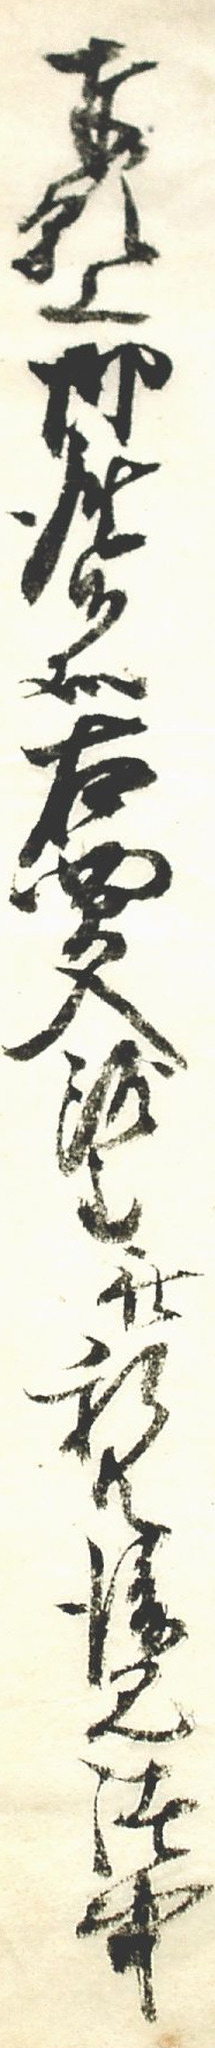奉願上御座候処右買入致上幷私共後見諸事
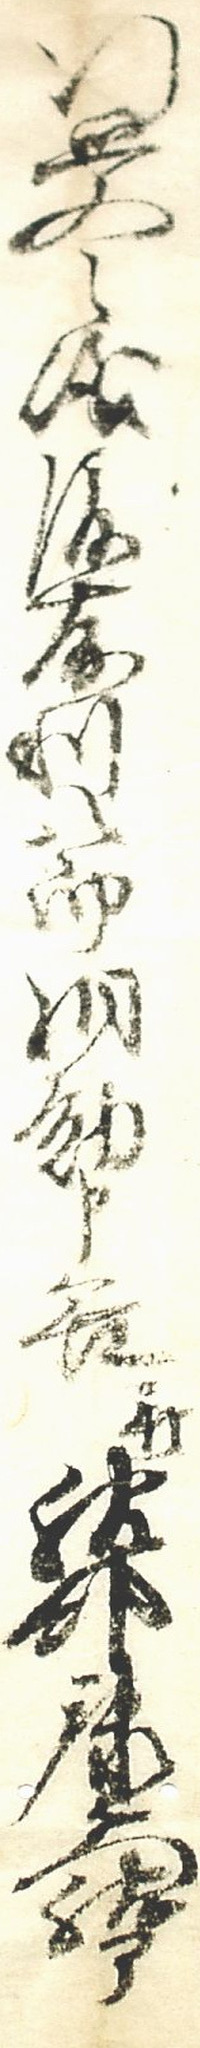引廻入之儀後藤利八郎相勧申筈幷服部康右衛門服部
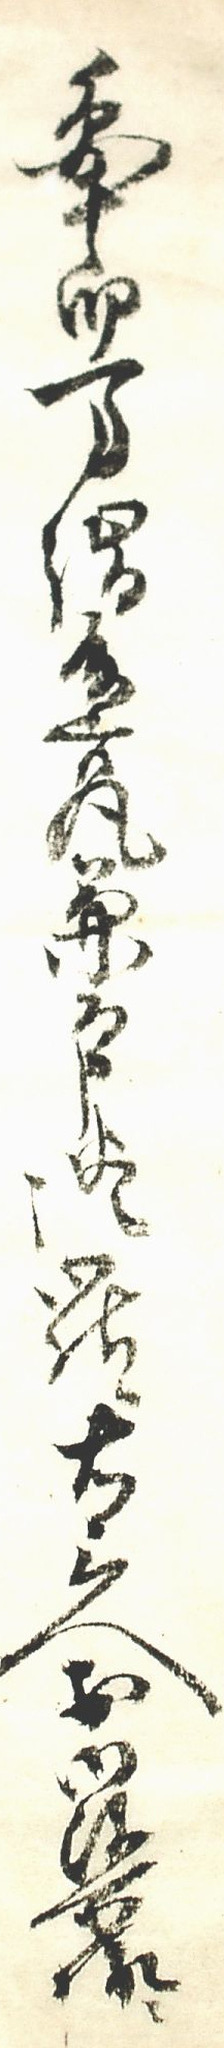円十郎万端取上合兼而申上候御座候右三人於御役所様に
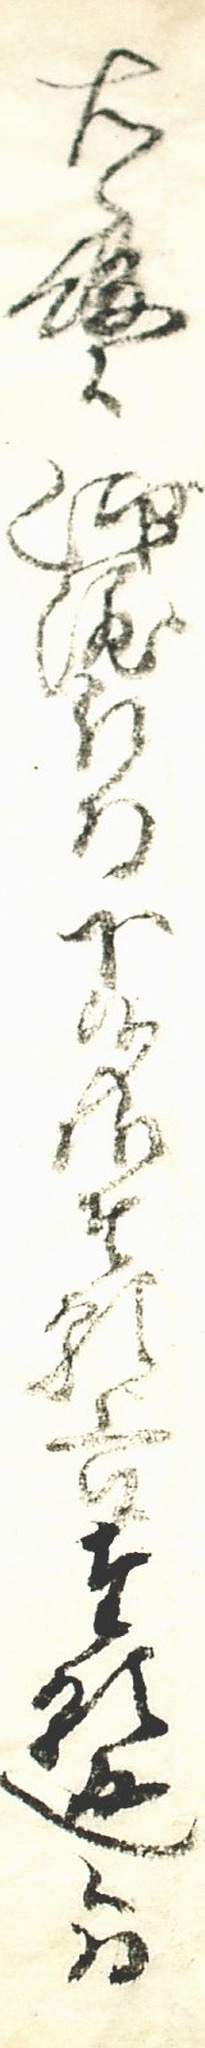右之趣被仰渡被為下候様奉願上候奉願通被為
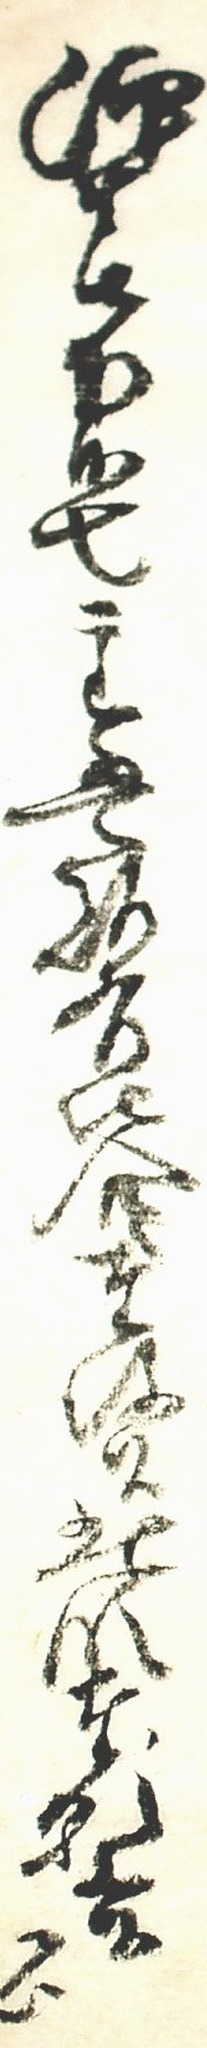仰付被下候は重ねて難有仕合に奉存候此段奉願上候以上
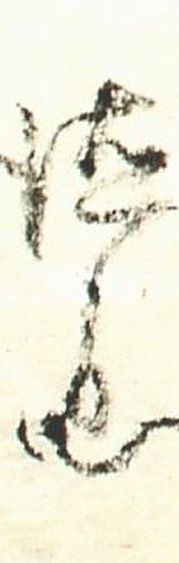徳兵衛
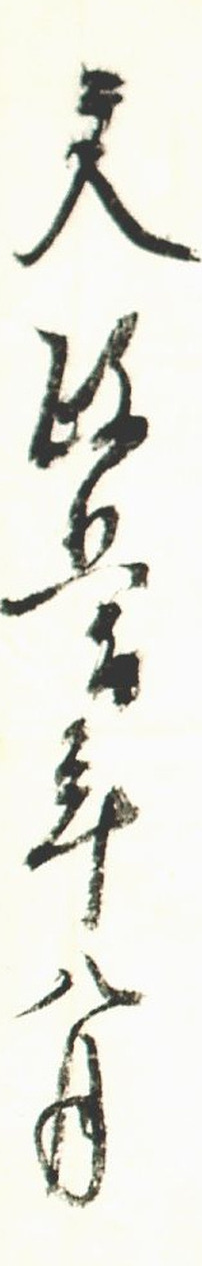文政五午年八月
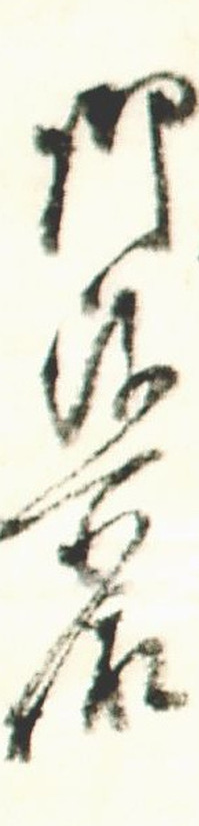御役所様
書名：申達（山城谷漆買付役後藤利八郎、小川徳兵衛両名任命）
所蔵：鳴門教育大学 Naruto University of Education
